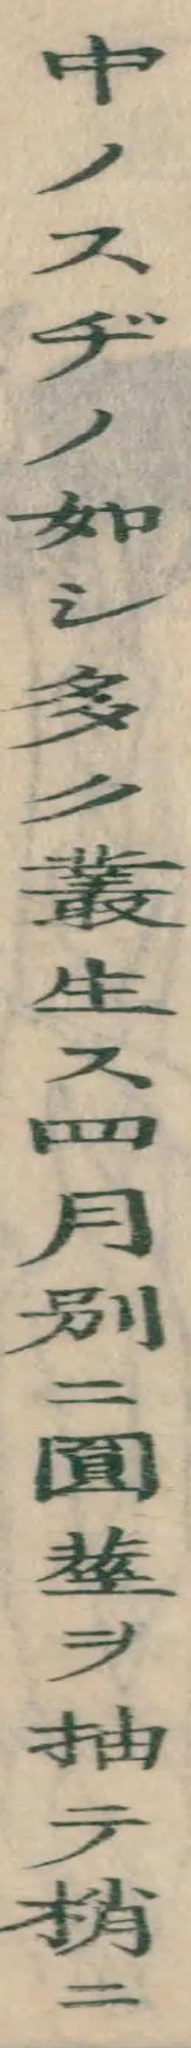中ノスヂノ如シ多ク叢生ス四月別ニ円茎ヲ抽テ梢ニ
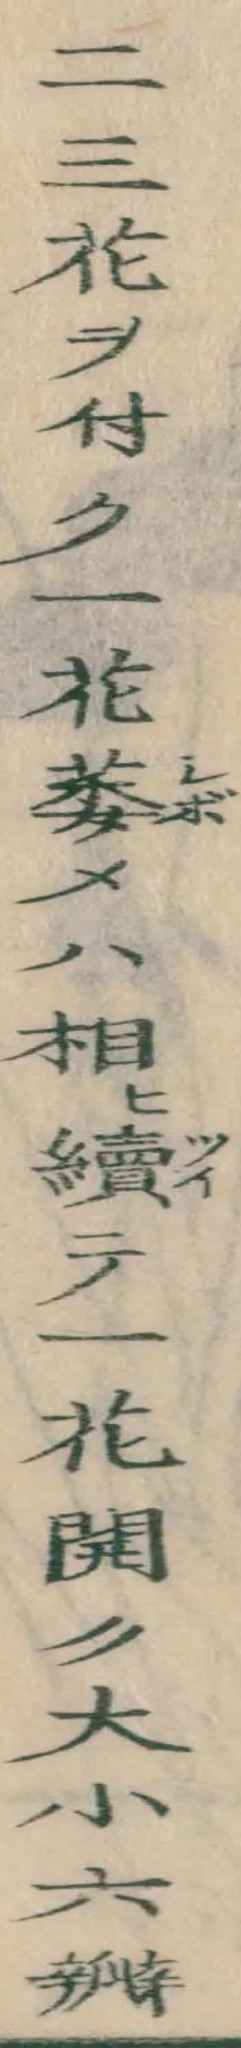二三花ヲ付ク一花萎メハ相続テ一花開ク大小六弁
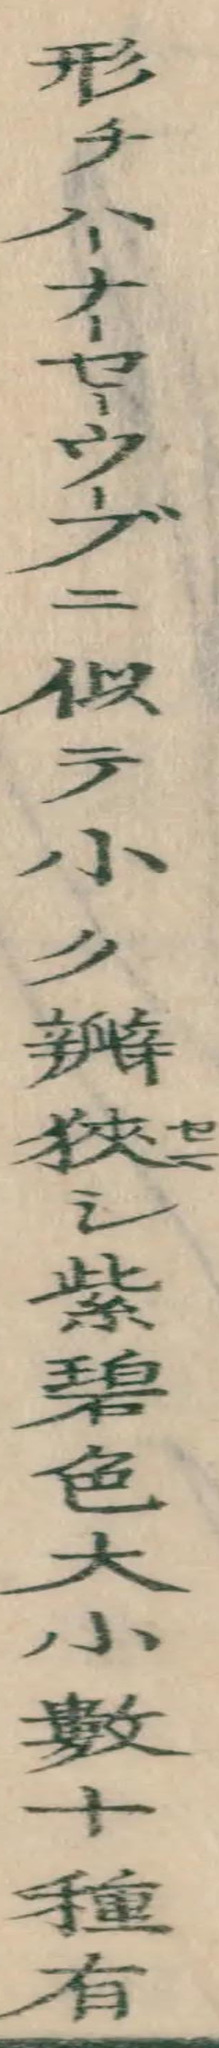形チハ-ナ-セ-ウ-ブニ似テ小ク弁狭シ紫碧色大小数十種有
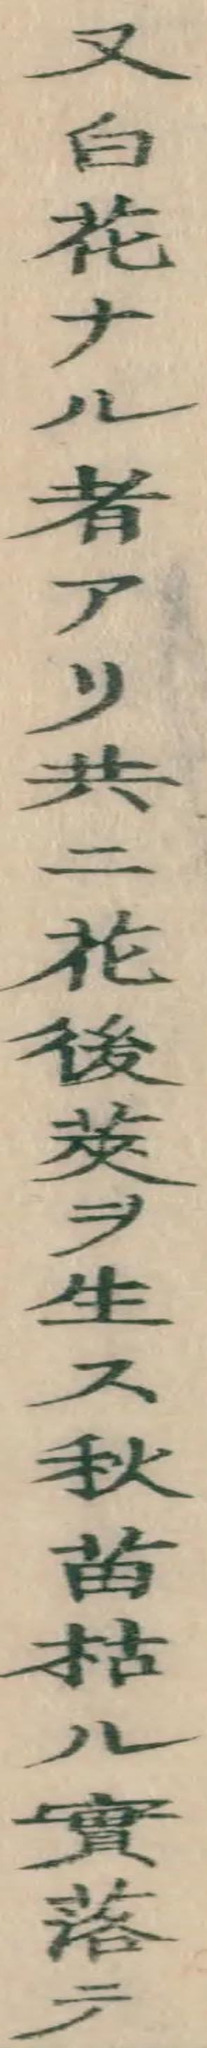又白花ナル者アリ共ニ花後莢ヲ生ス秋苗枯ル実落テ
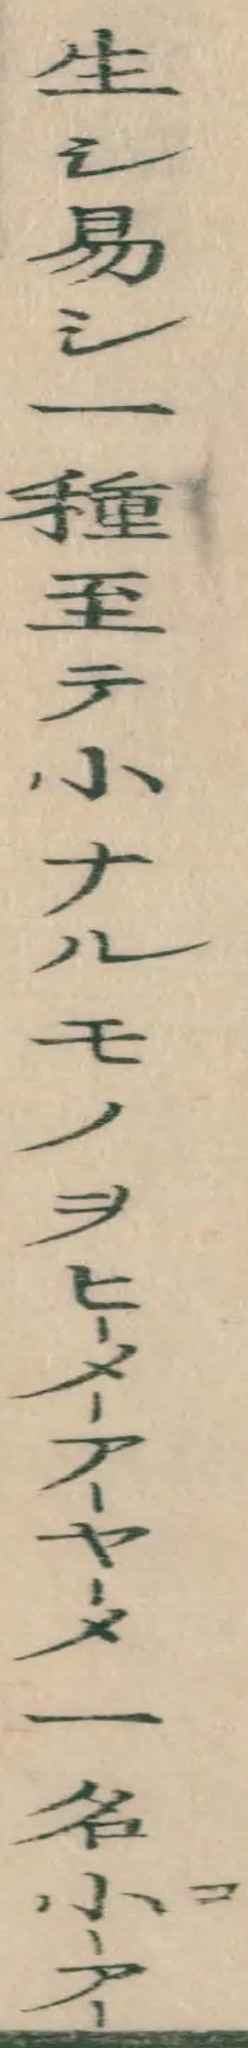生シ易シ一種至テ小ナルモノヲヒ-メ-ア-ヤ-メ一名小-ア-
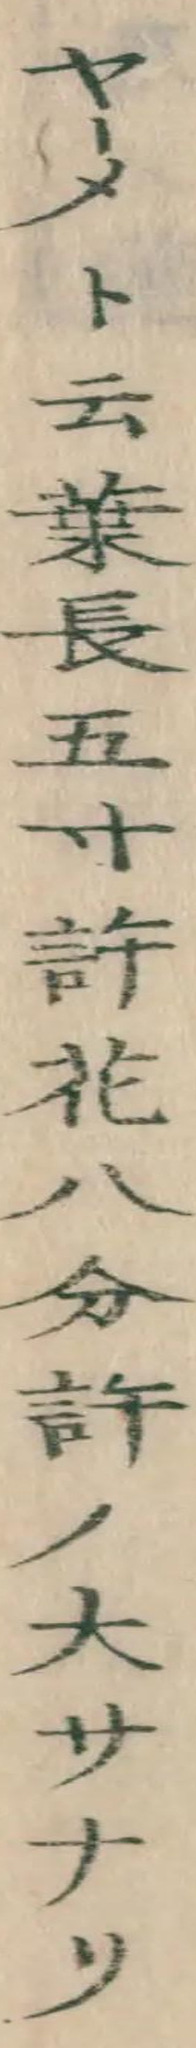ヤ-メト云葉長五寸許花八分許ノ大サナリ
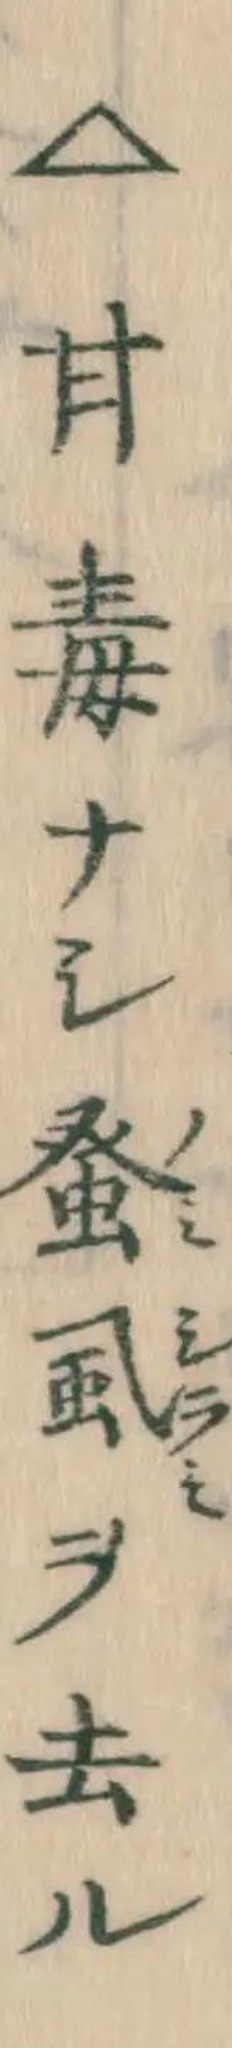△甘毒ナシ蚤虱ヲ去ル

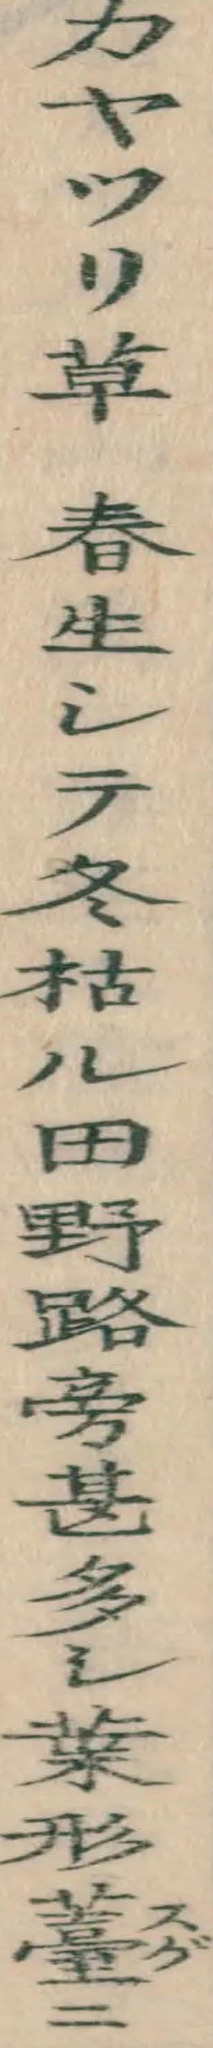カヤツリ草春生シテ冬枯ル田野路旁甚多シ葉形薹ニ
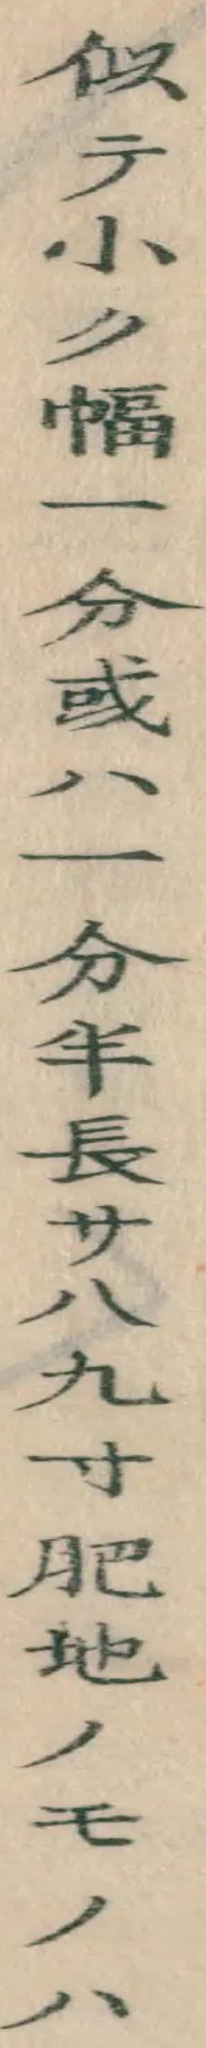似テ小ク幅一分或ハ一分半長サ八九寸肥地ノモノハ
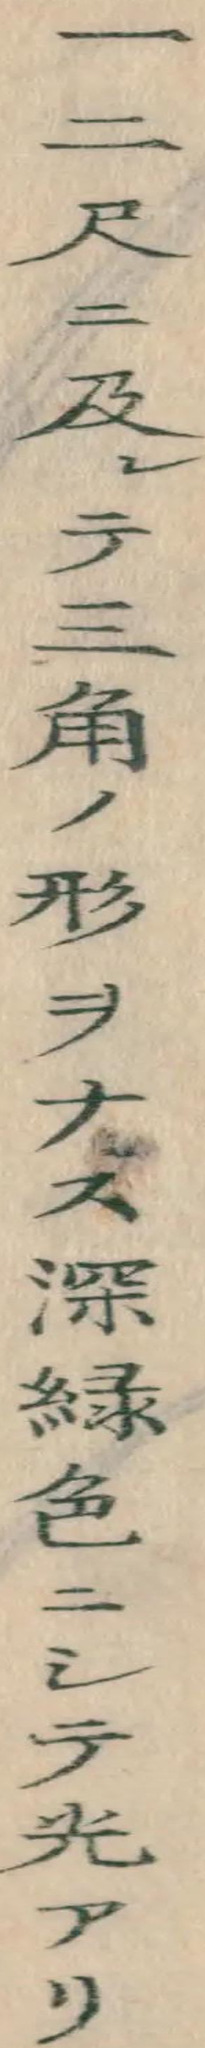一二尺ニ及テ三角ノ形ヲナス深緑色ニシテ光アリ
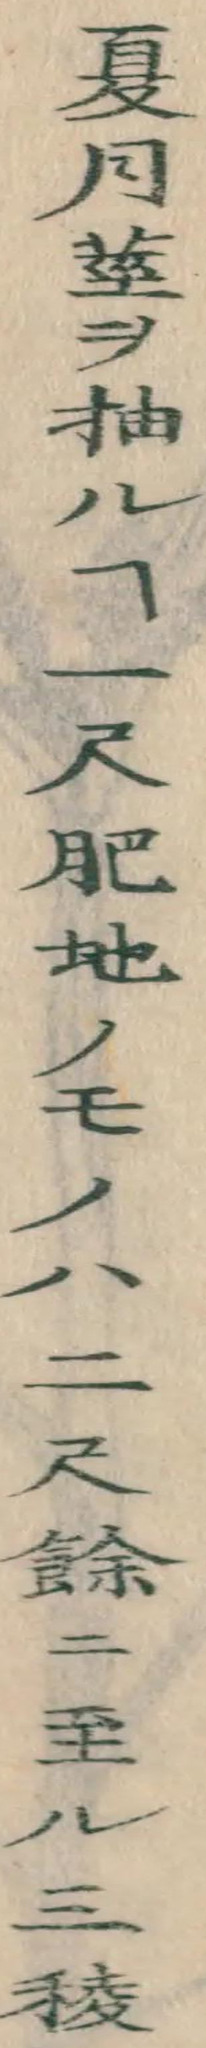夏月茎ヲ抽ルコト一尺肥地ノモノハ二尺余ニ至ル三稜
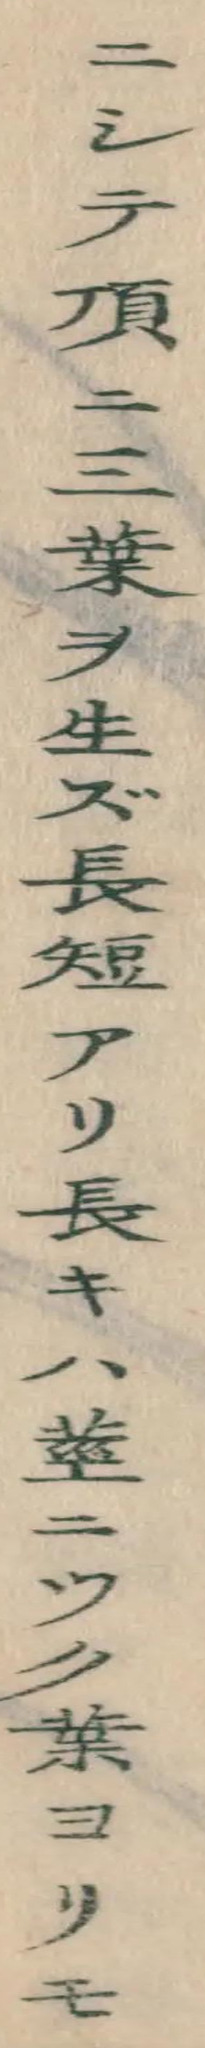ニシテ頂ニ三葉ヲ生ズ長短アリ長キハ茎ニツク葉ヨリモ
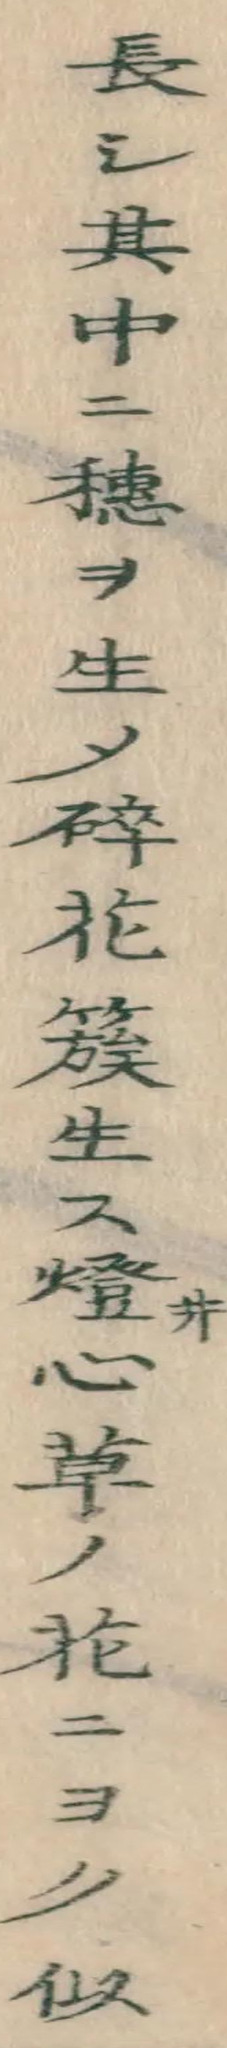長シ其中ニ穂ヲ生シテ砕花簇生ス燈心草ノ花ニヨク似
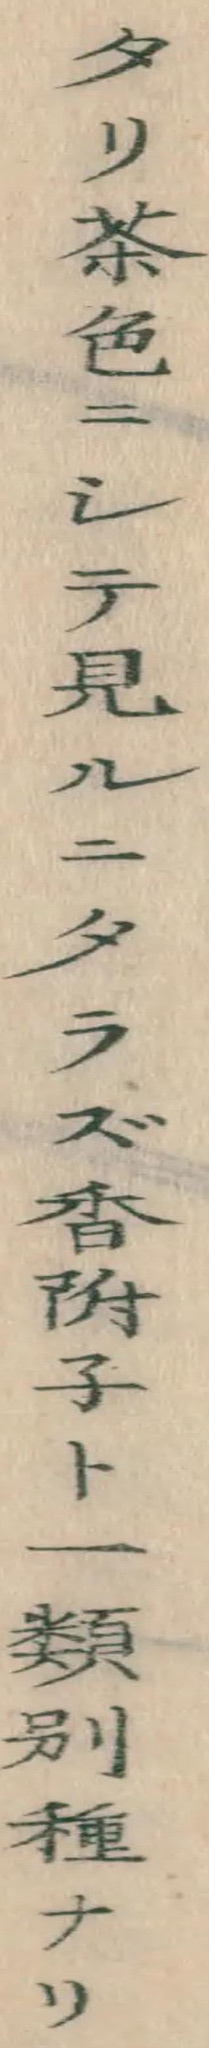タリ茶色ニシテ見ルニタラズ香附子ト一類別種ナリ
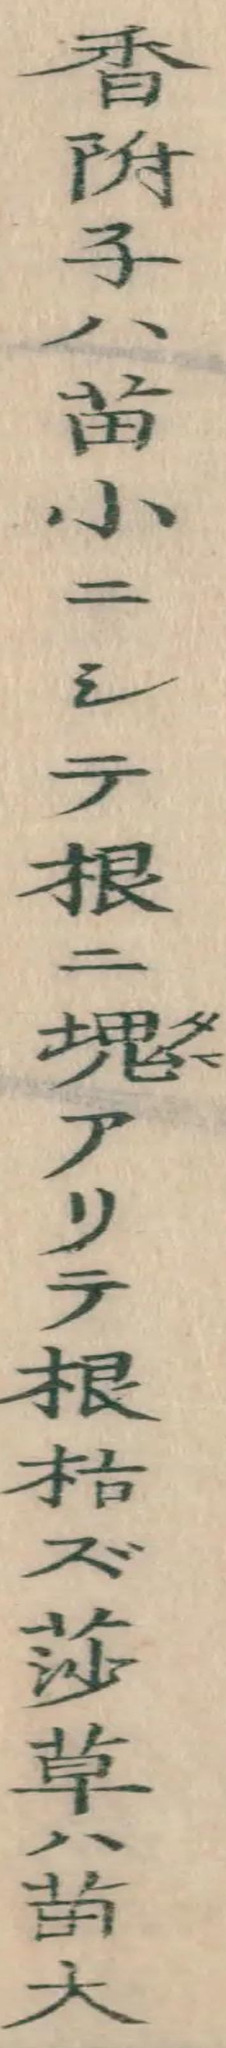香附子ハ苗小ニシテ根ニ塊アリテ根枯ズ莎草ハ苗大
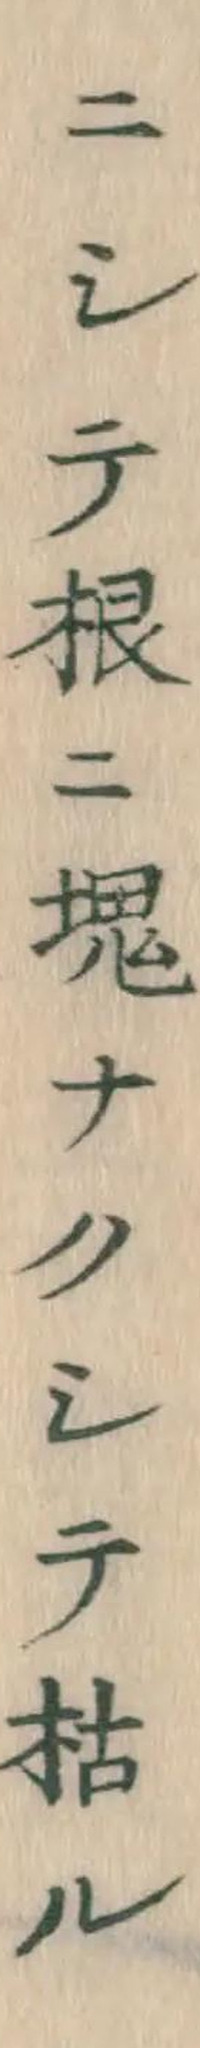ニシテ根ニ塊ナクシテ枯ル
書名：これこれ草 2巻. [2]
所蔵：国立国会図書館 National Diet Library, JAPAN
